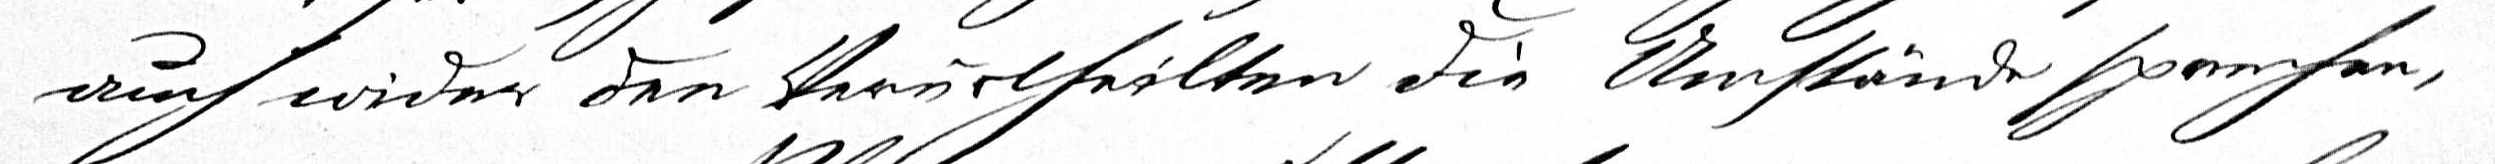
auch wider den Verurtheilten die Umstände sprechen,
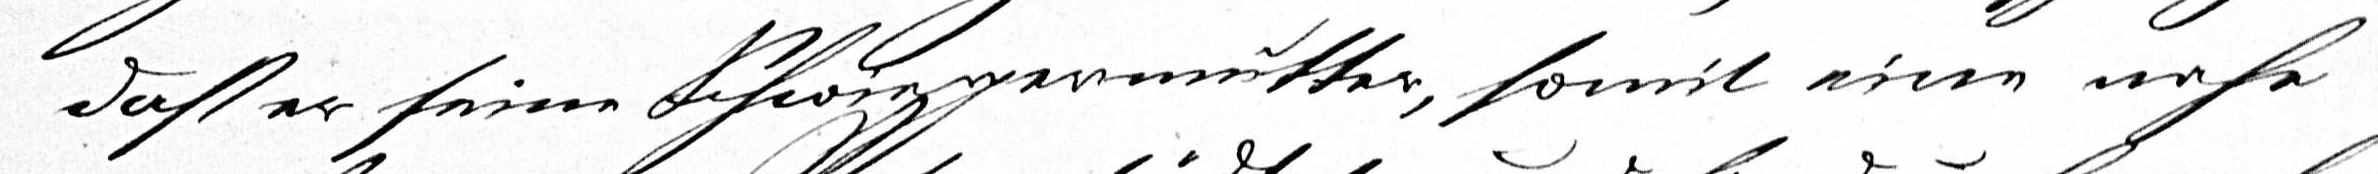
daß er seine Schwiegermutter, somit eine nahe
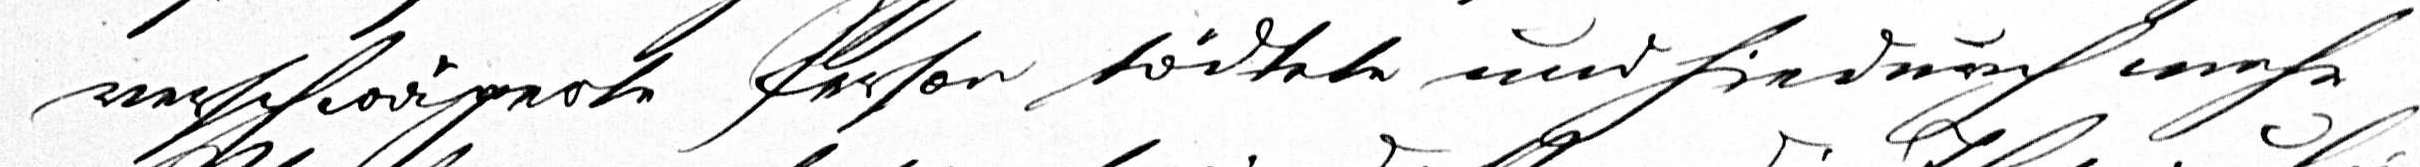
verschwägerte Person tödtete und hiedurch imhe
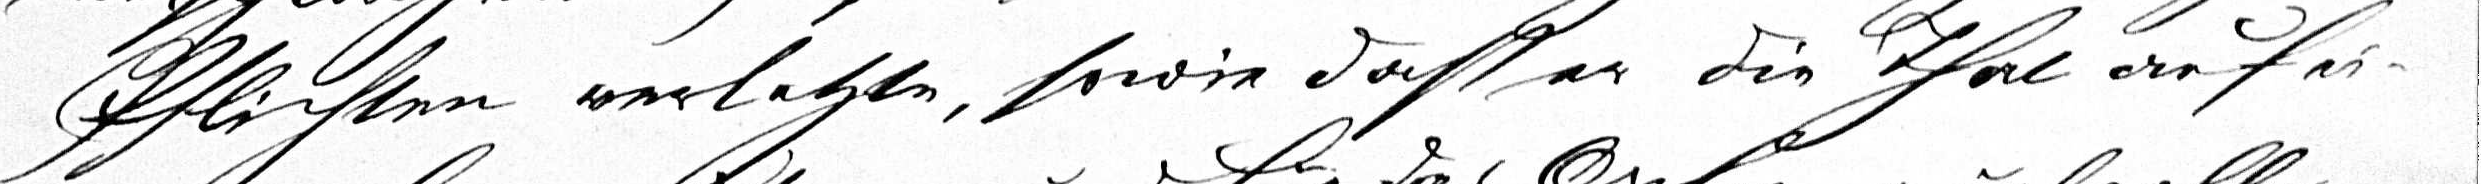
Pflichten verletzte, sowie daß er die That auf ei¬
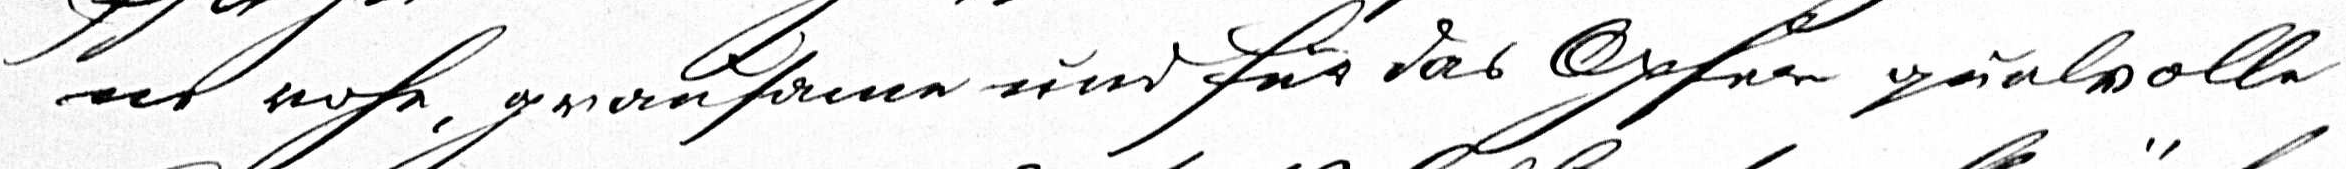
ne rohe, grausame und für das Opfer qualvolle
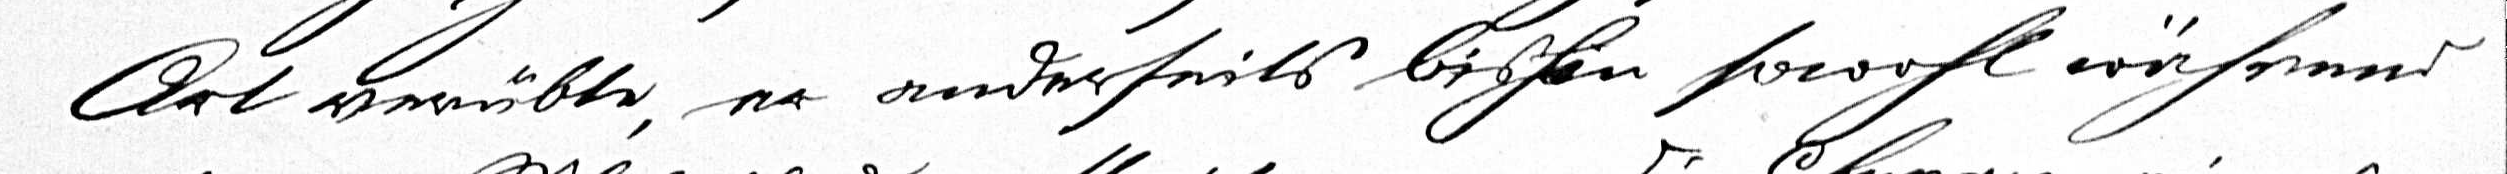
Art verübte, er anderseits bisher sowohl während
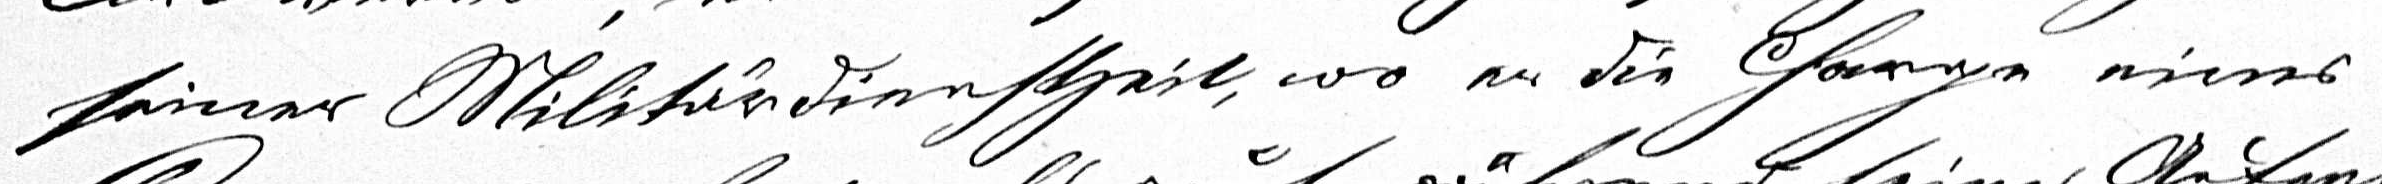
seiner Militärdienstzeit, wo er die Charge eines
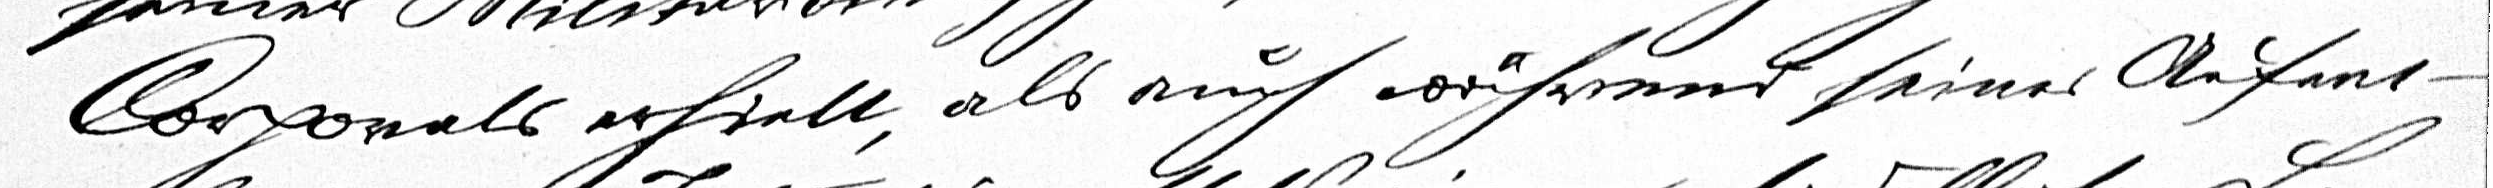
Corporals erhielt, als auch während seiner Aufent¬
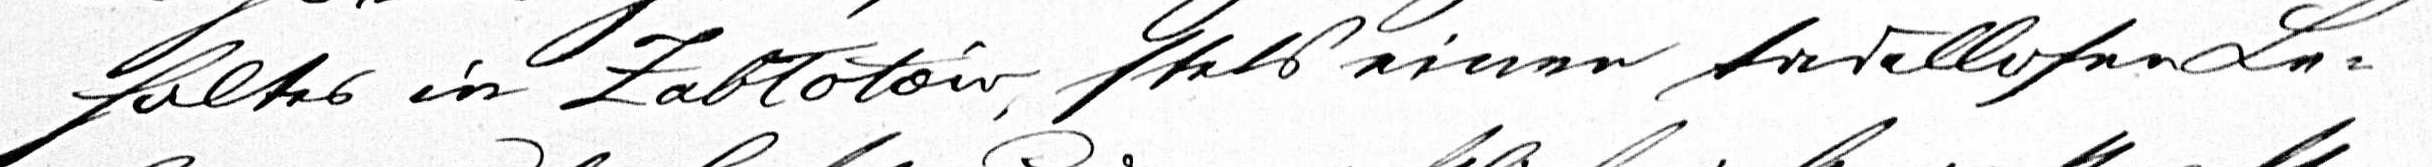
haltes in Zabłotów, stets einen tadellosen Le¬
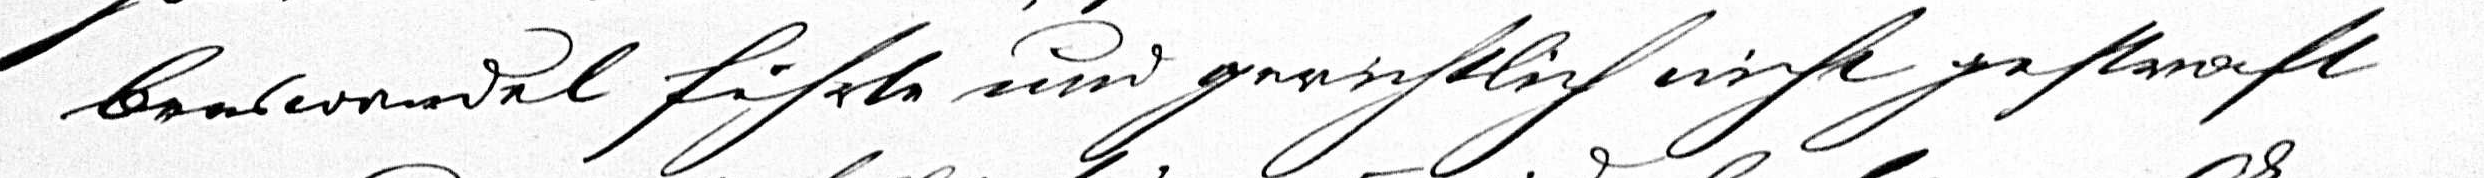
benswandel führte und gerichtlich nicht gestraft
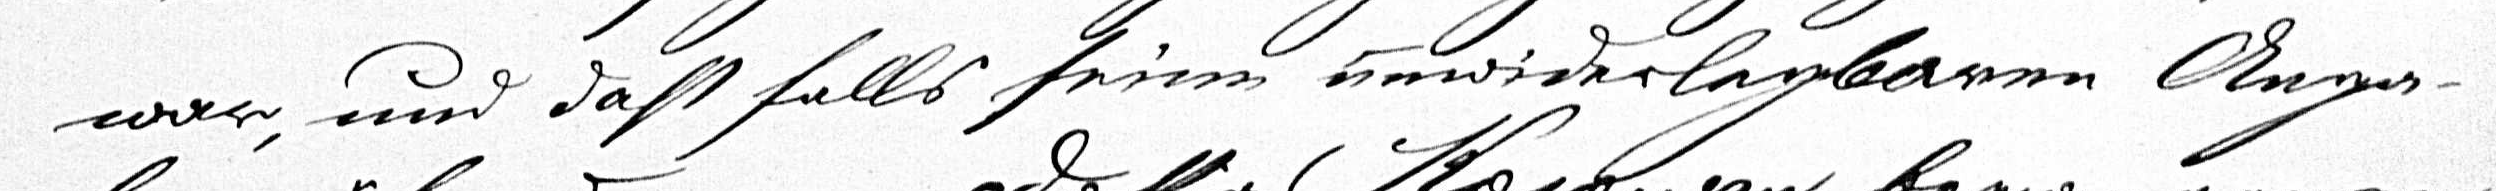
war, und daß falls seine unwiderlegbaren Ange¬
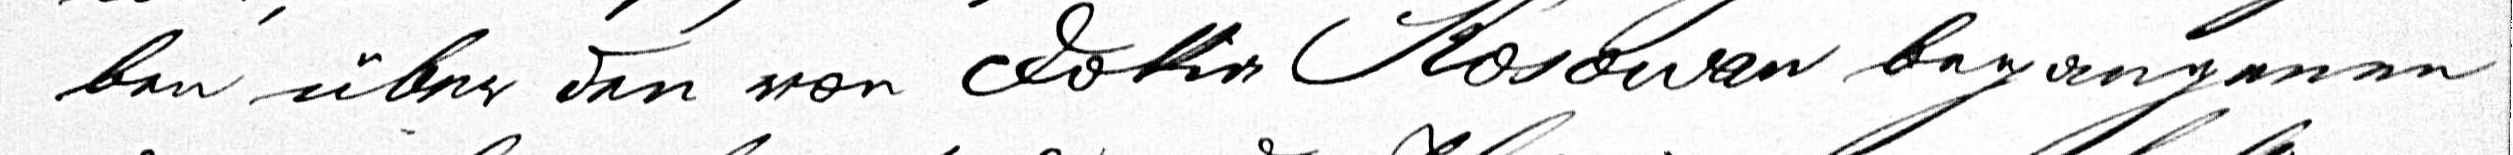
ben über den von Dokia Kosowan begangenen
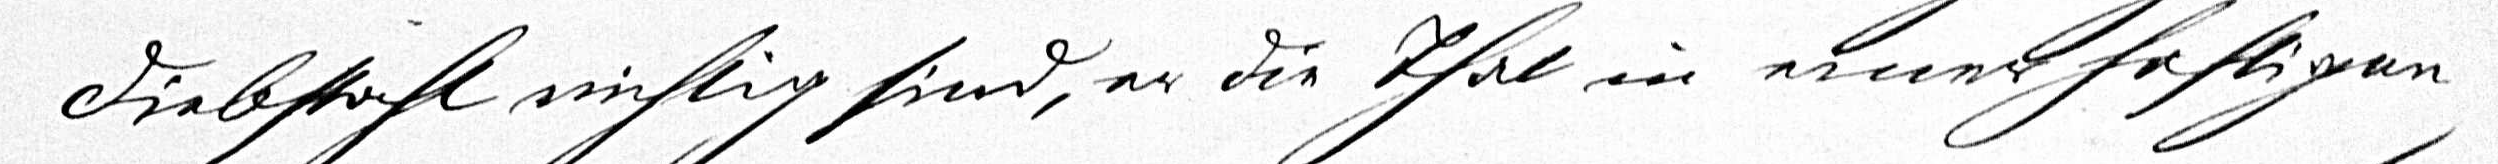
Diebstahl richtig sind, er die That in einer heftigen
